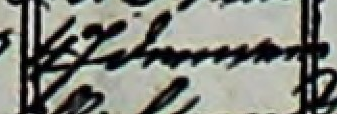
47 de???
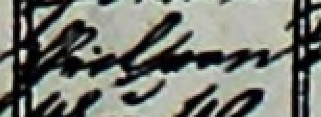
Priltron
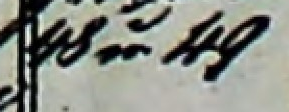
48 u 49
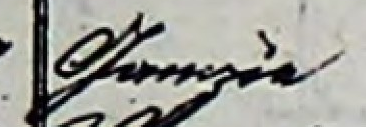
Ganzin
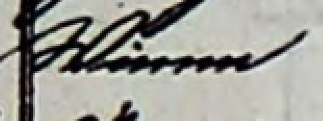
Wimm
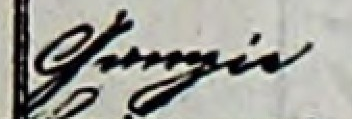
Ganzin
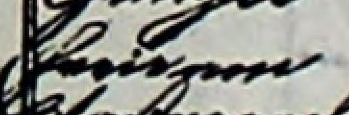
Freie von
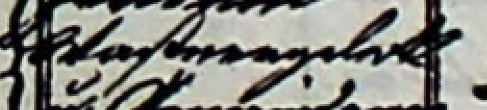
Wasteragaldt
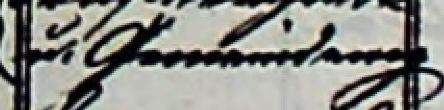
u. Gemeindering
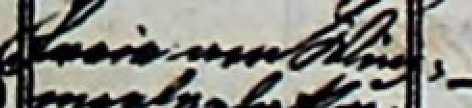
Svein am Win?„
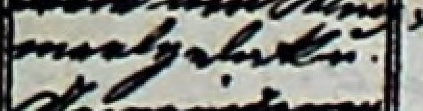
merlgelak u.
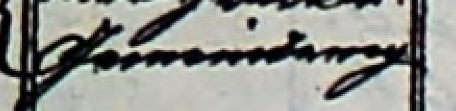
Gemeindering
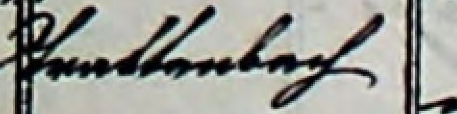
Strattenbach
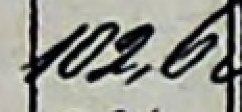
102,6
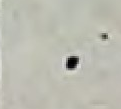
.
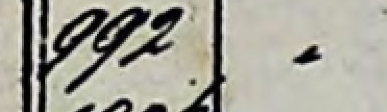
992 „
